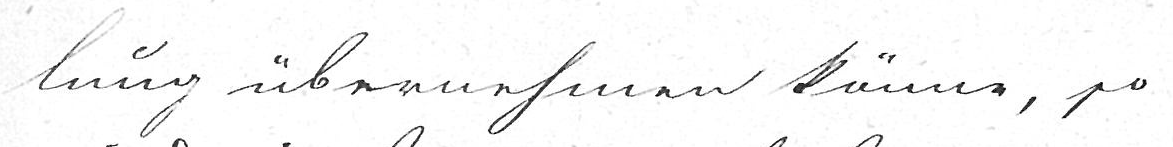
lung übernehmen könne, so
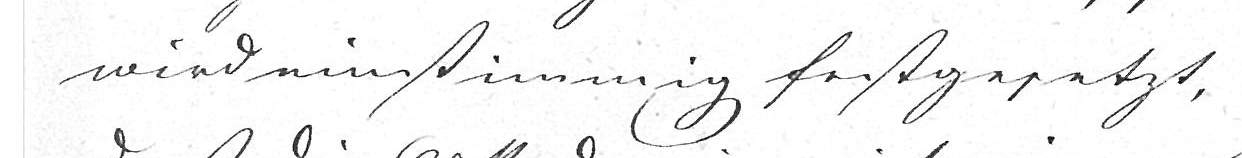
wird einstimmig festgesetzt,
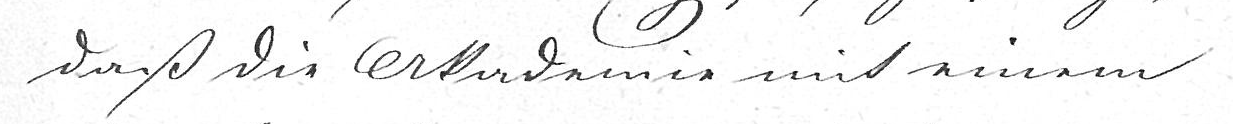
daß die Akademie mit einem
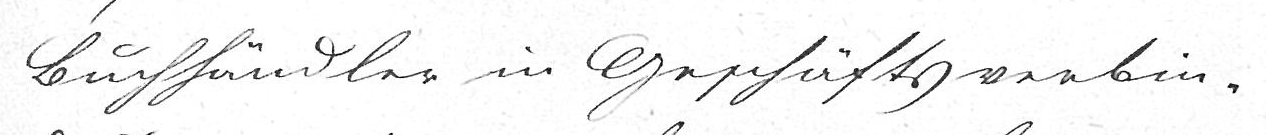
Buchhändler in Geschäftsverbin-
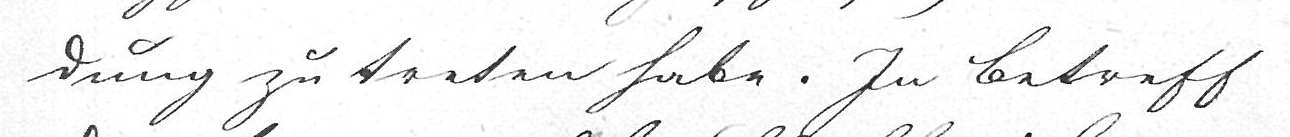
gung zu treten habe. In Betreff
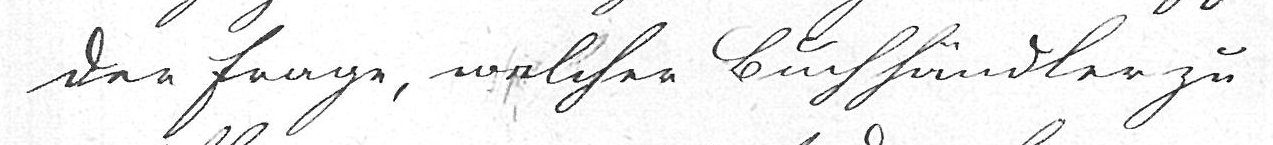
der Frage, welcher Buchhändler zu
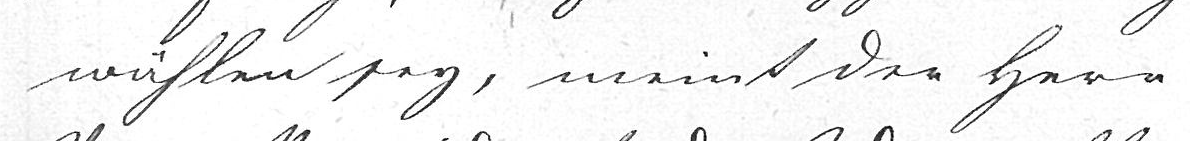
wählen sey, meint der Herr
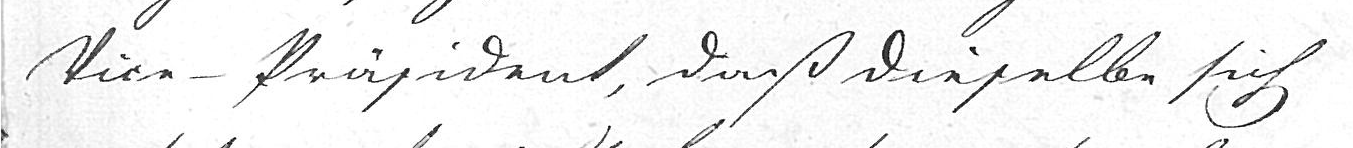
Vice-Präsident, daß dieselbe sich
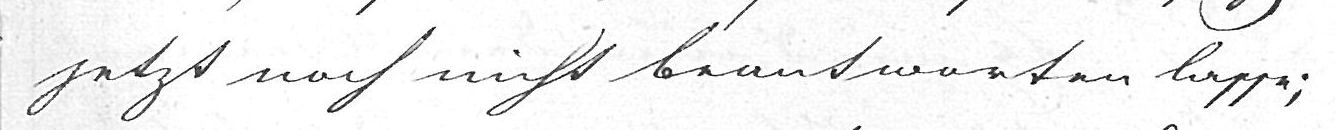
jetzt noch nicht beantworten lasse;
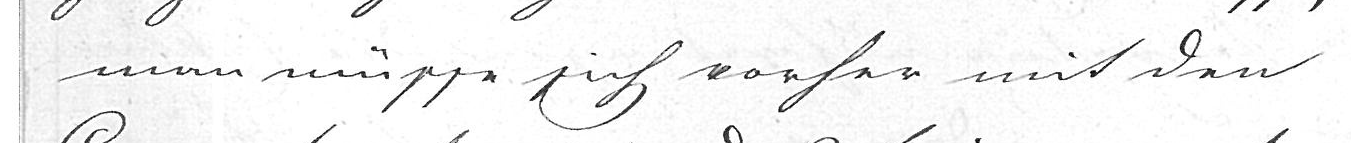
man müsse sich vorher mit den
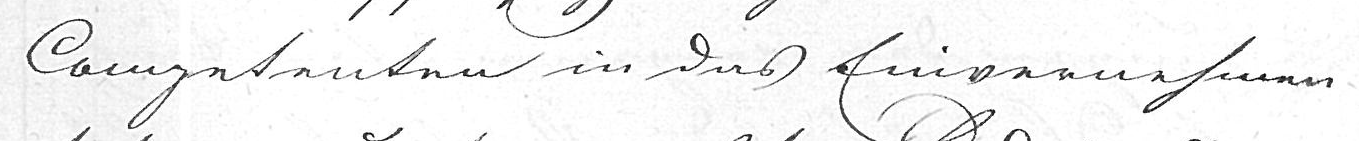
Competenten in das Einvernehmen
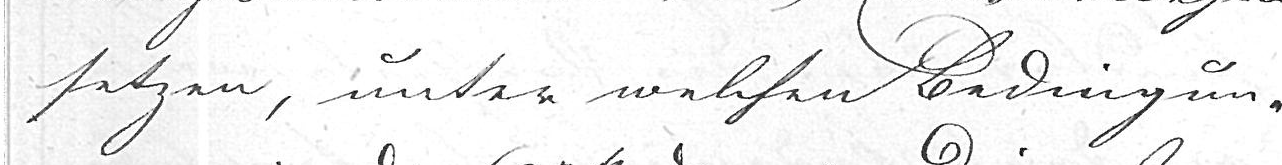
setzen, unter welchen Bedingun-
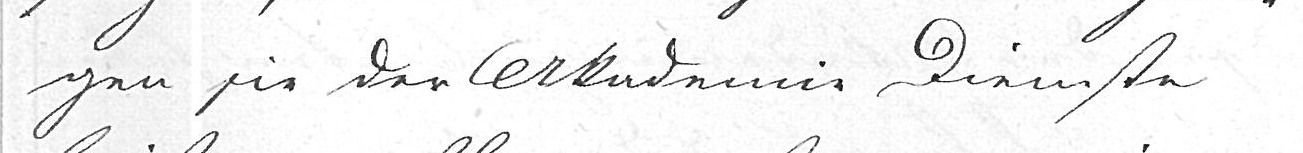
gen sie derAkademie Dienste
